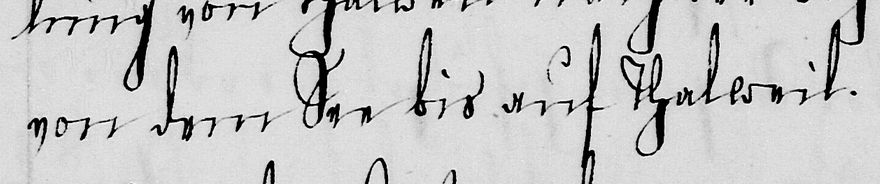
von dem See auf Thalweil.
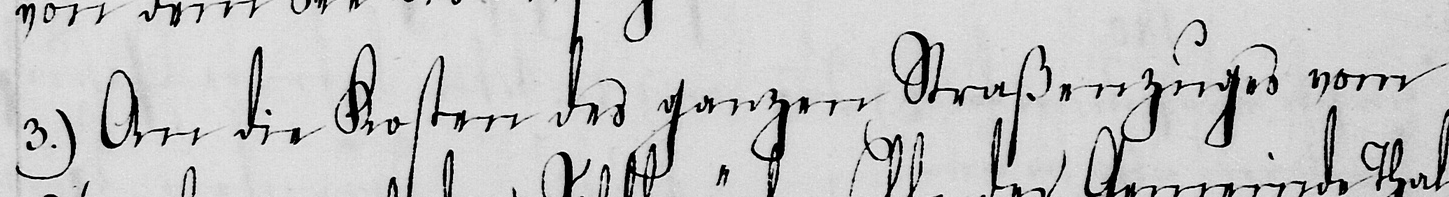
3.) An die Kosten des ganzen Straßenzuges vom
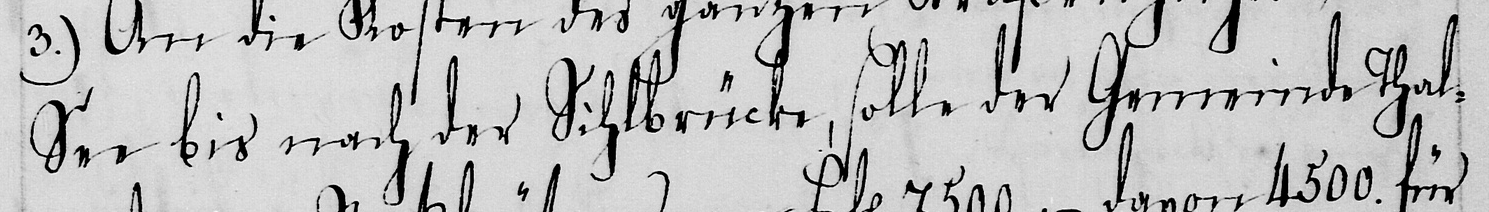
See bis nach der Sihlbrücke, solle der Gemeinde Thal¬
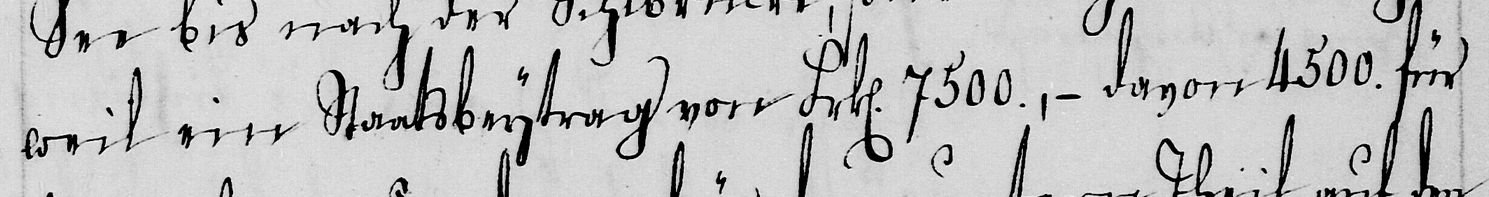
weil ein Staatsbeytrag von Frk[en]. 7'500., – davon 4500. für
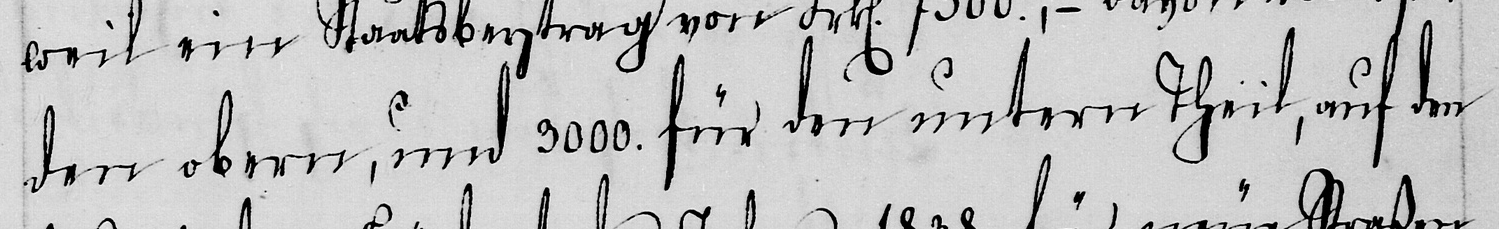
den obern, und 3000. für den untern Theil, auf den
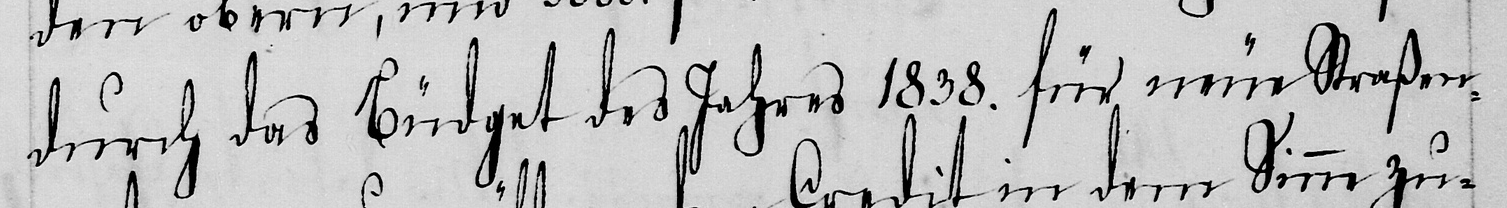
durch das Büdget des Jahres 1838. für neue Straßen¬
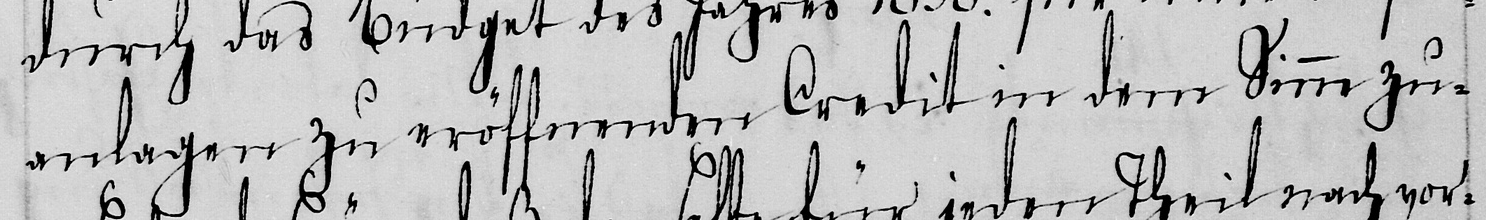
anlagen zu eröffnenden Credit in dem Sinne zu¬
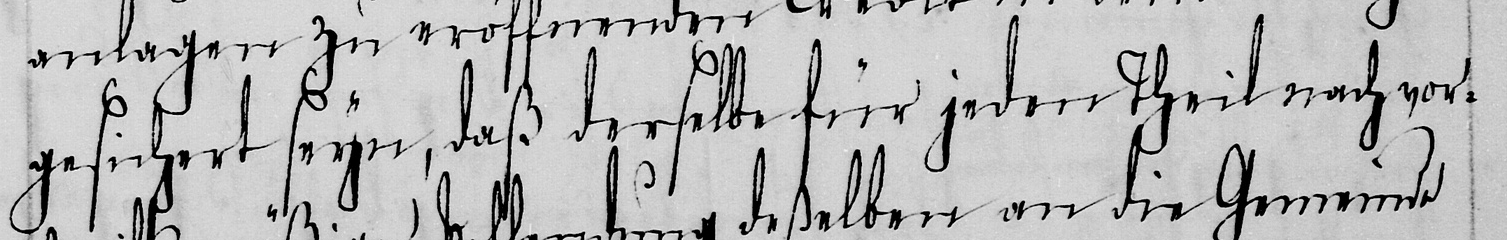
gesichert seyn, daß derselbe für jeden Theil nach vor¬
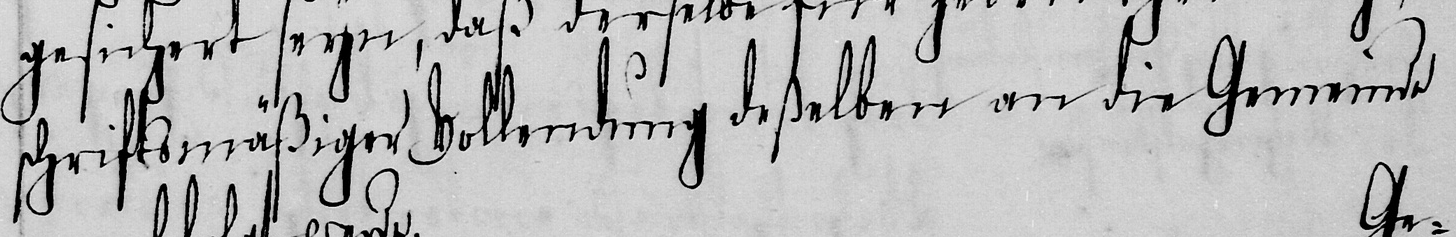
schriftsmäßiger Vollendung deßelben an die Gemeinde
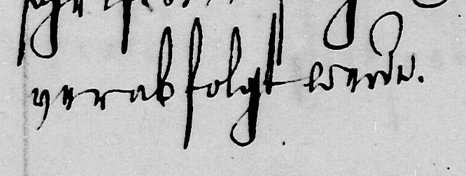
verabfolgt werde.
